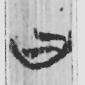曰
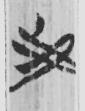我
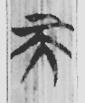天
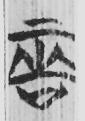{巫口}
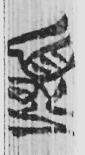夏
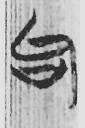句
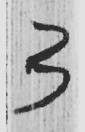乃
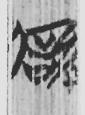{人言糸}
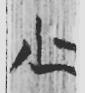少
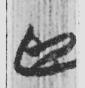臣
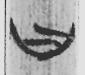曰
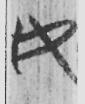女
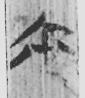尔
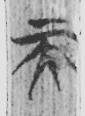天
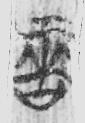{巫口}
